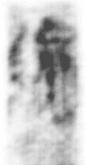○（養）
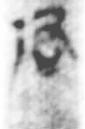君
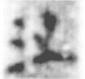之
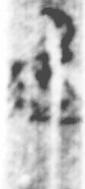○（路）
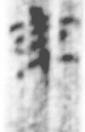車
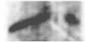一
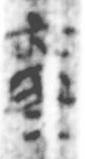𨍱（乘）
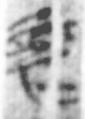麗
